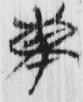東
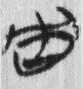周
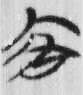客
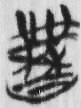○（許）
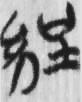○（盈）
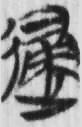歸
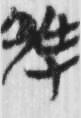○（胙）
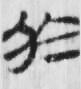於
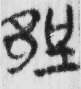郢
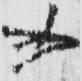之
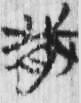歲（歲）
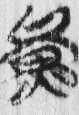○（爨）
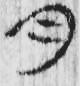月
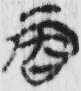丙
